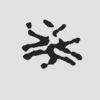至于
